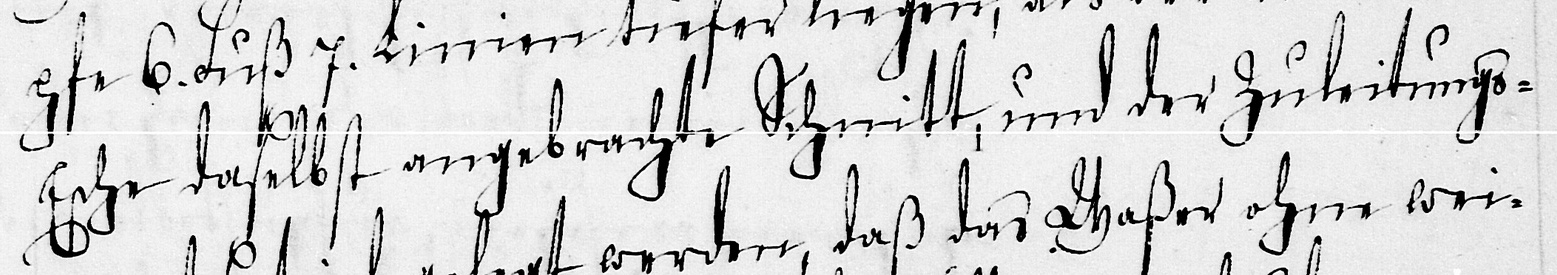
Esche daselbst angebrachte Schnitt, und der Zuleitungs¬
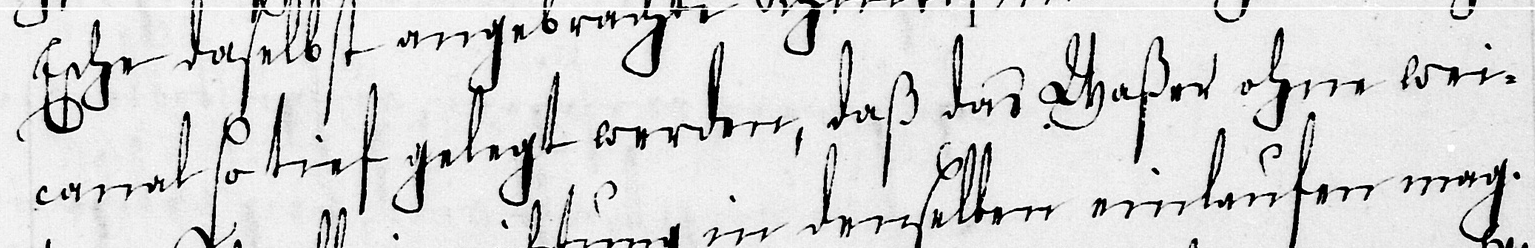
canal so tief gelegt werden, daß das Waßer ohne wei¬
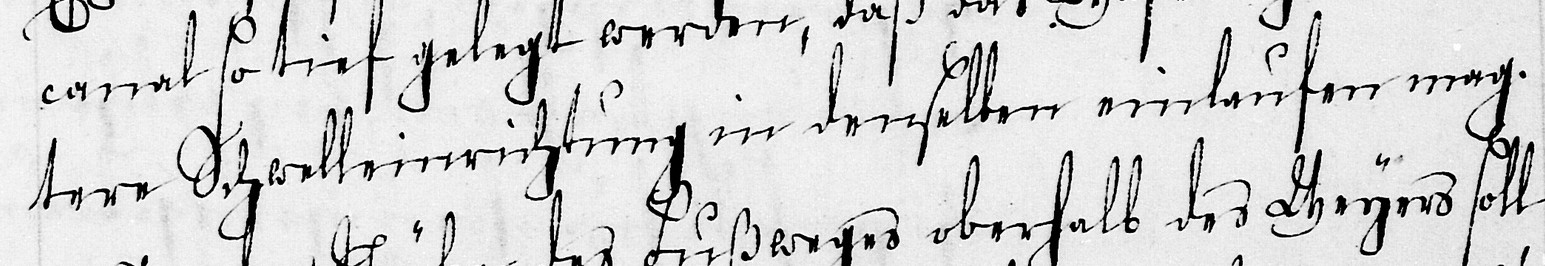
tere Schwelleinrichtung in denselben einlaufen mag.
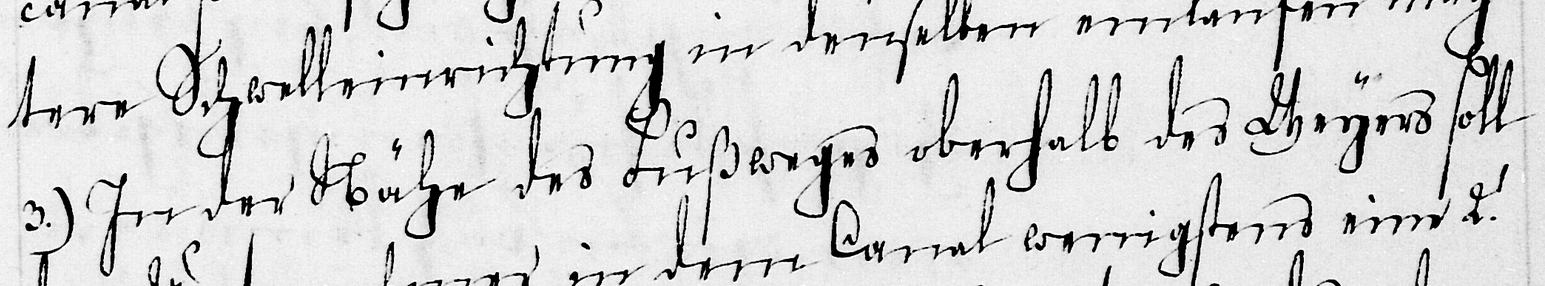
3.) In der Nähe des Fußweges oberhalb des Weyers soll
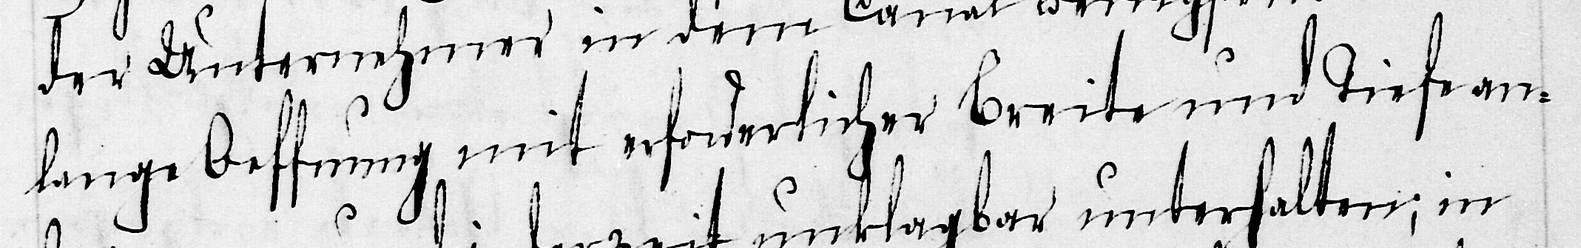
lange Oeffnung mit erforderlicher Breite und Tiefe an¬
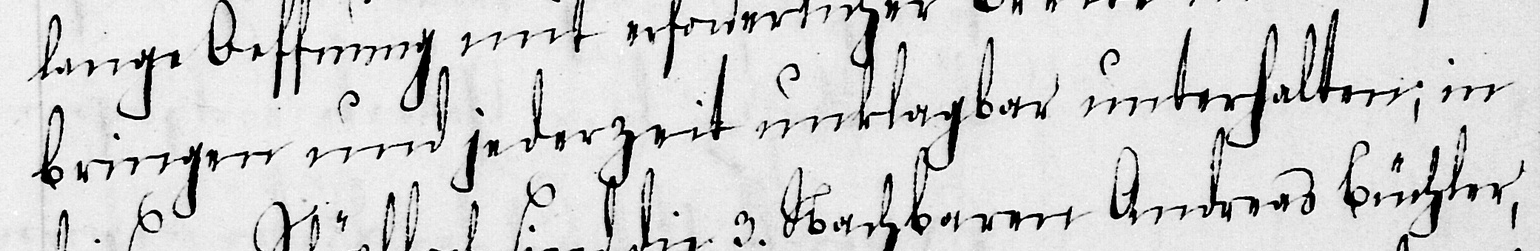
bringen und jederzeit unklagbar unterhalten; in
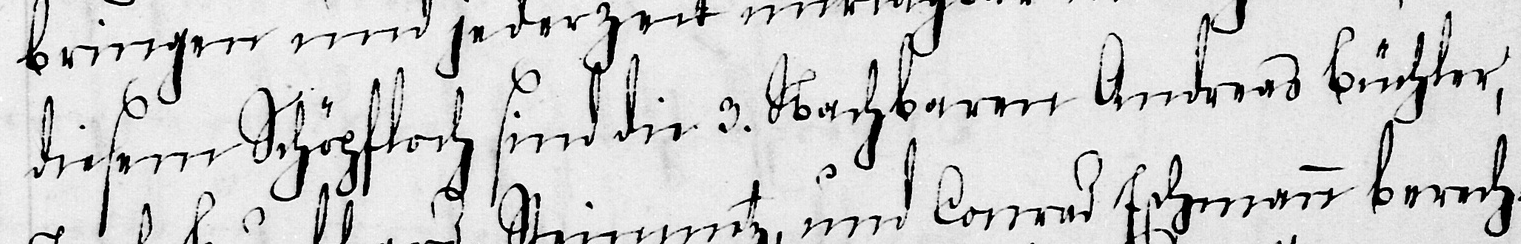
diesem Schöpfloch sind die 3. Nachbaren Andreas Büchler,
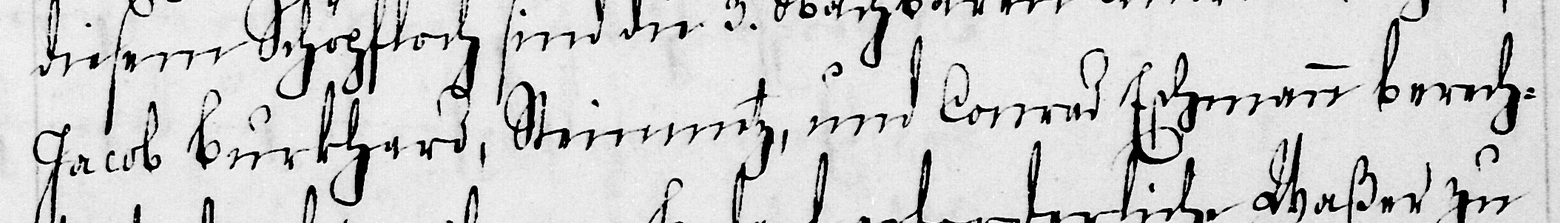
Jacob Burkhard, Steinmetz, und Conrad Eschmann berech¬
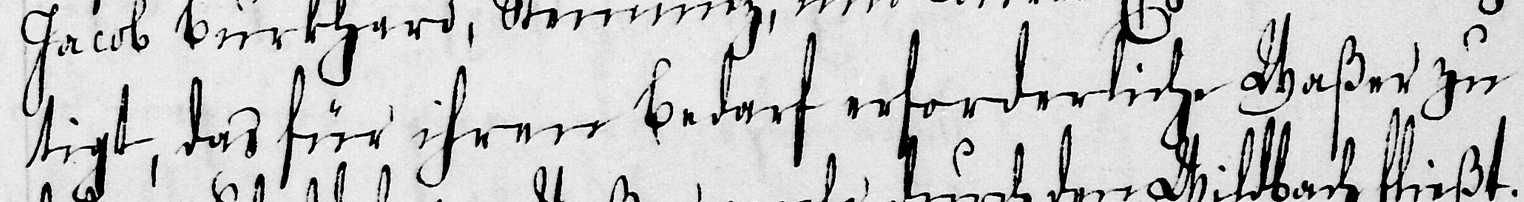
tigt, das für ihren Bedarf erforderliche Waßer zu
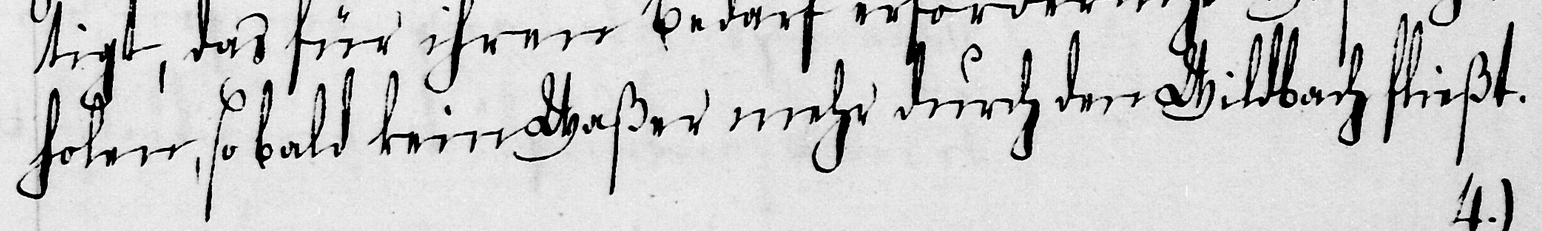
holen, so bald kein Waßer mehr durch den Wildbach fließt.
